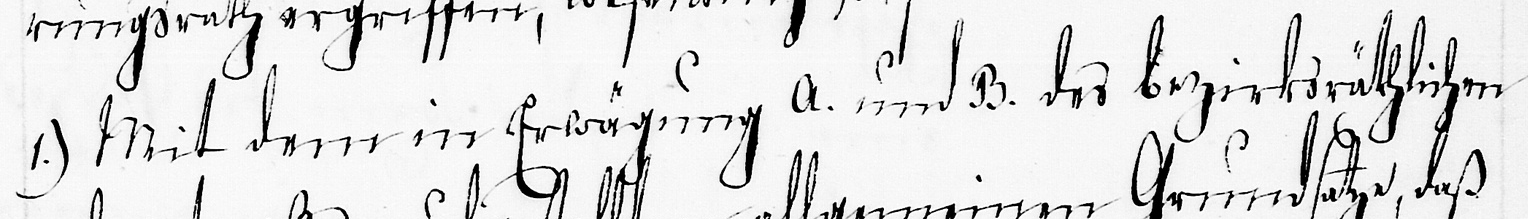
1.) Mit dem in Erwägung A. und B. des bezirksräthlichen
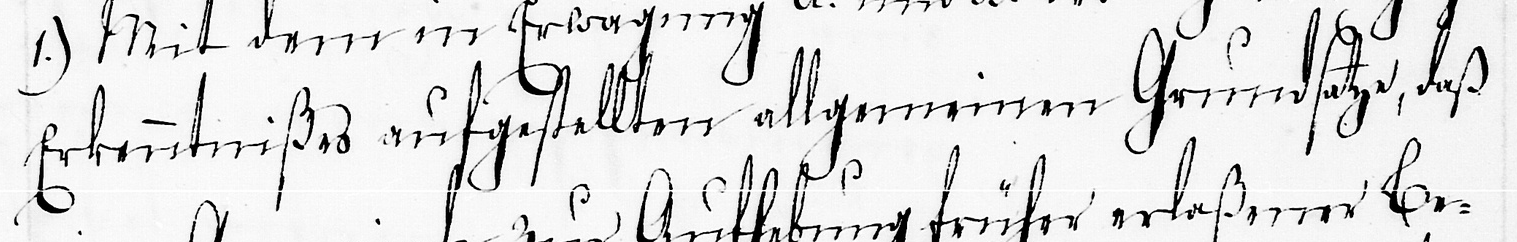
Erkenntnißes aufgestellten allgemeinen Grundsatze, daß
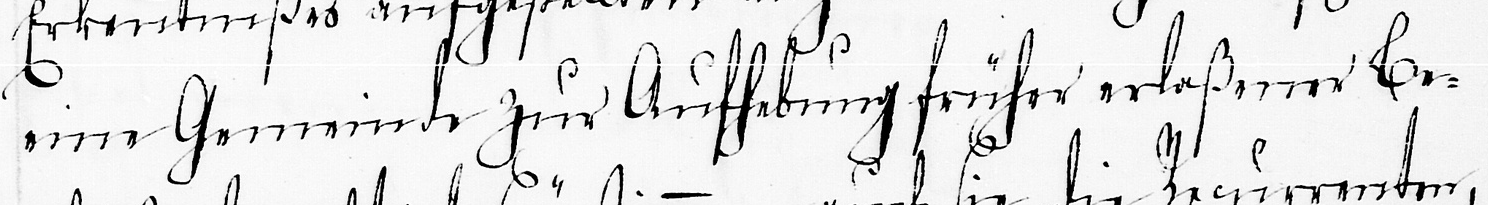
eine Gemeinde zur Aufhebung früher erlaßener Be¬
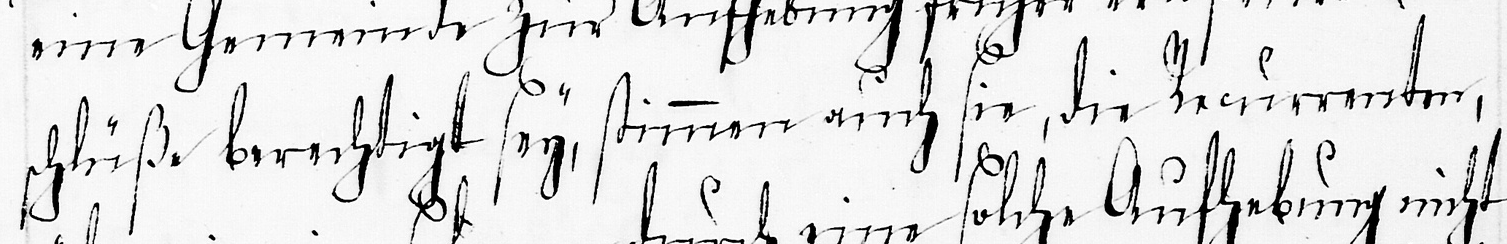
schlüße berechtigt sey, stimmen auch sie, die Recurrenten,
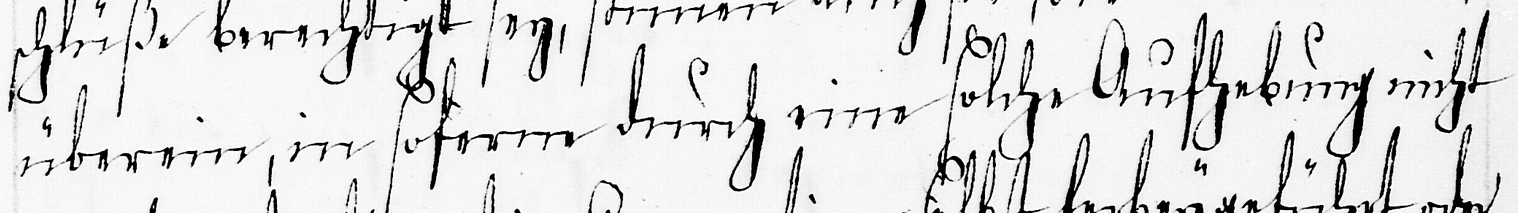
überein, in soferne durch eine solche Aufhebung nicht
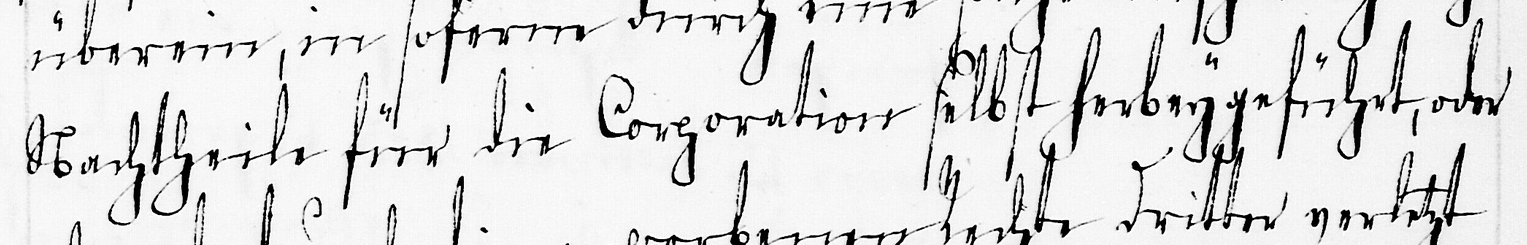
Nachtheile für die Corporation selbst herbeygeführt, oder
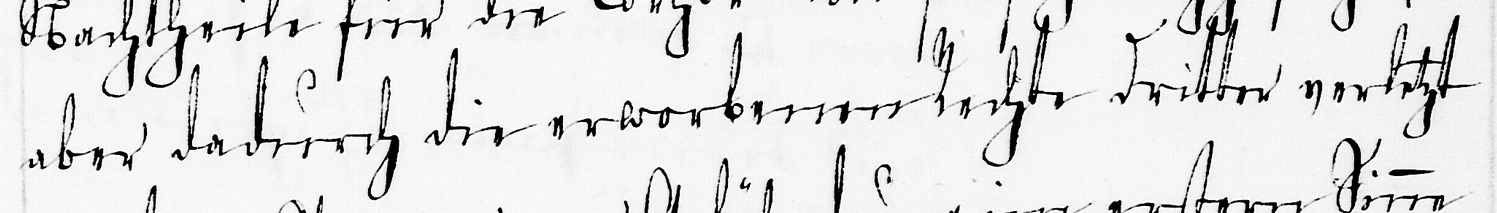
aber dadurch die erworbenen Rechte Dritter verletzt
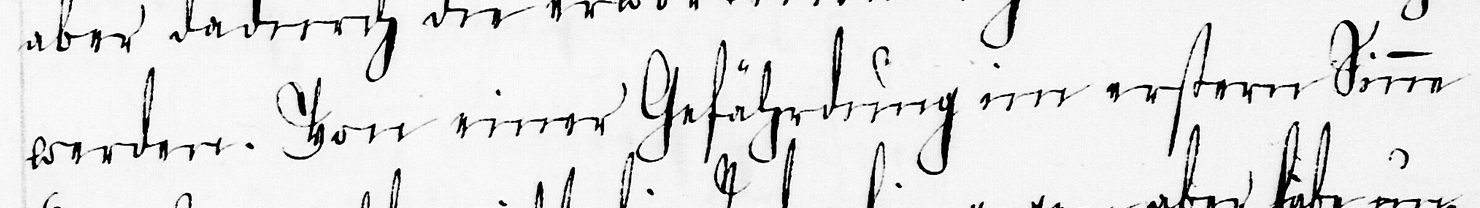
werden. Von einer Gefährdung im erstern Sinne
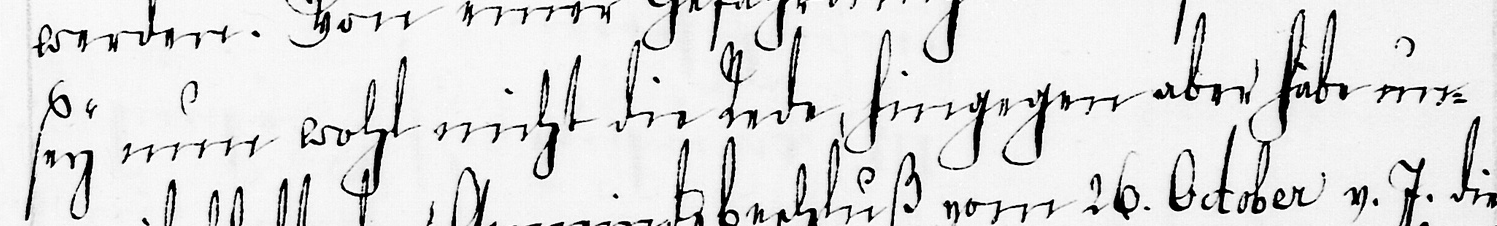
sey nun wohl nicht die Rede, hingegen aber habe un¬
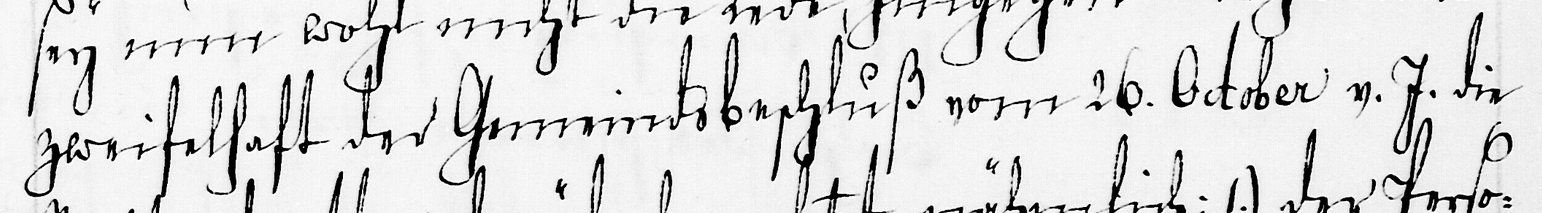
zweifelhaft der Gemeindsbeschluß vom 26. October v. J. die
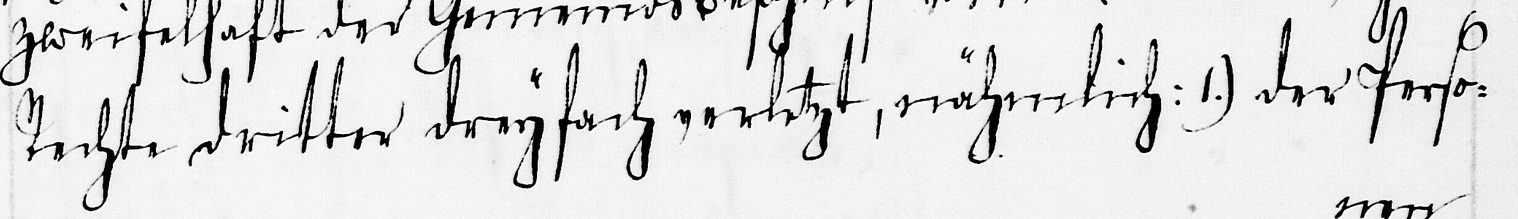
Rechte dritter dreyfach verletzt, nähmlich: 1.) der Perso-
